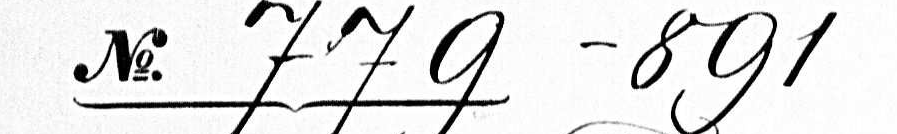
No. 779 – 1891
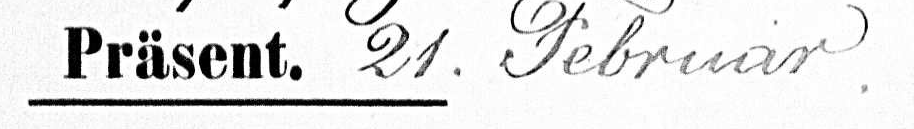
Präsent. 21. Februar
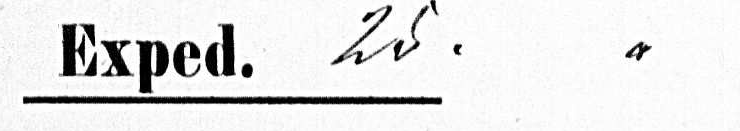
Expedit 25. Februar
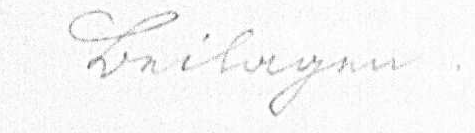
Beilagen
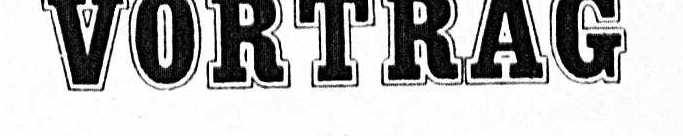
VORTRAG
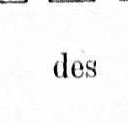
des
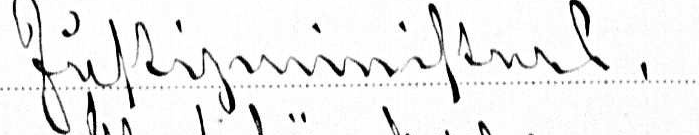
Justizministers
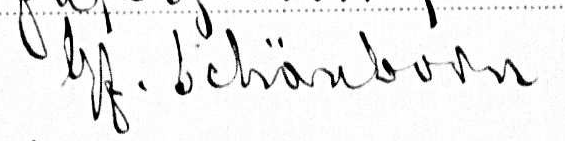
Gf Schönborn
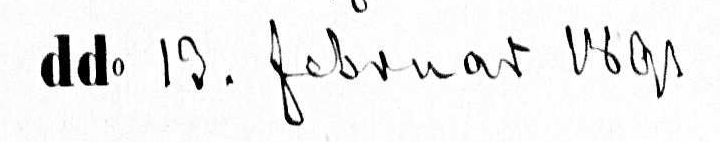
Ddo 13 Februar 1891
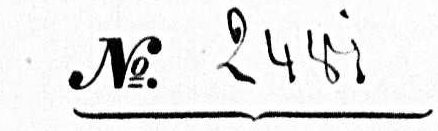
No 2481
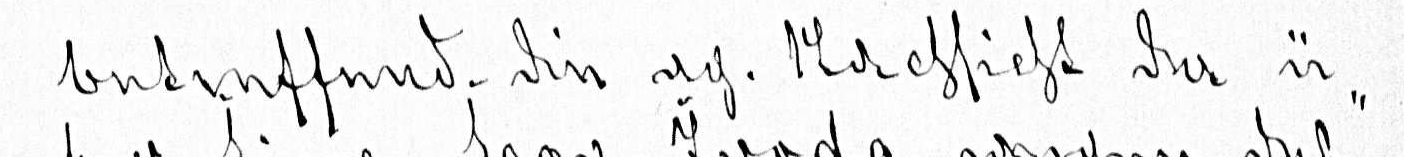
Betreffend die ag. Nachsicht der ü¬
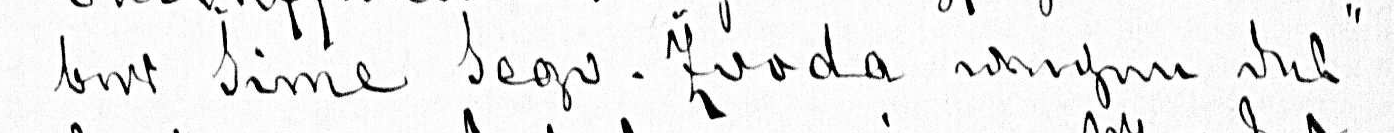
ber Šime Šego-Žvoda wegen des
